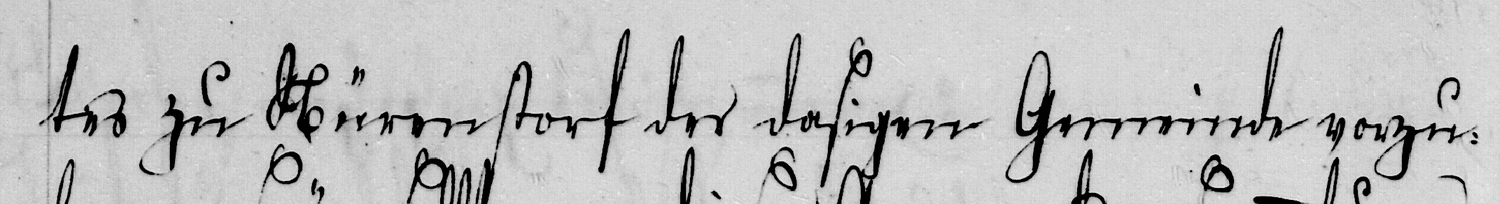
tes zu Nürenstorf der dasigen Gemeinde vorzu¬
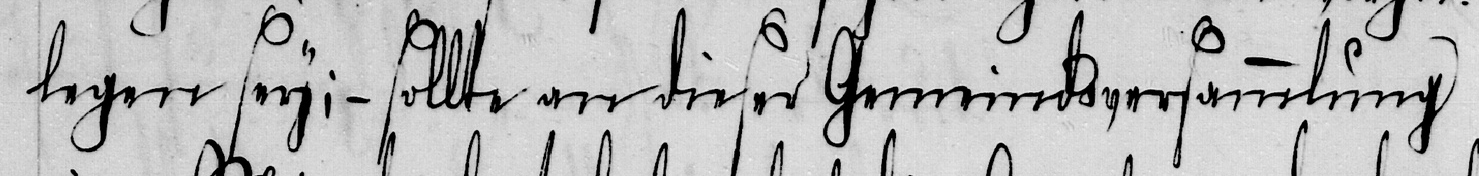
legen sey; – sollte an dieser Gemeindsversammlung
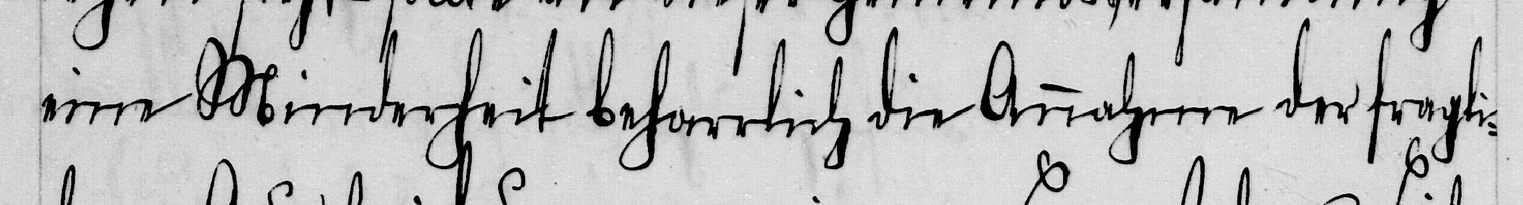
eine Minderheit beharrlich die Annahme der fragl¬
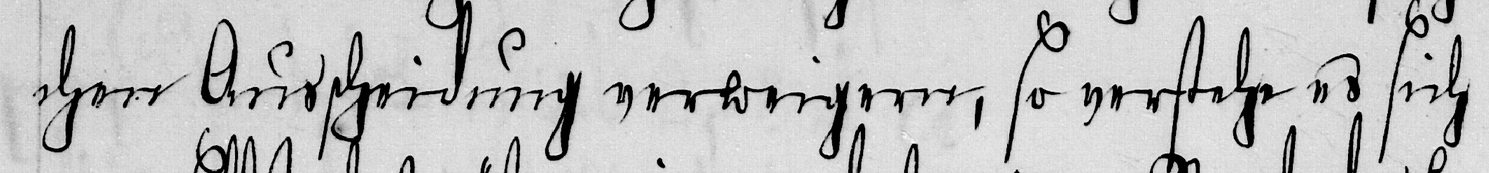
ichen Ausscheidung verweigern, so verstehe es sich
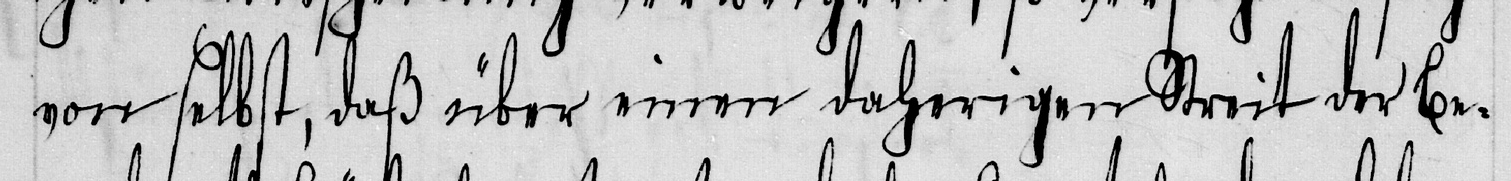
von selbst, daß über einen daherigen Streit der Be¬
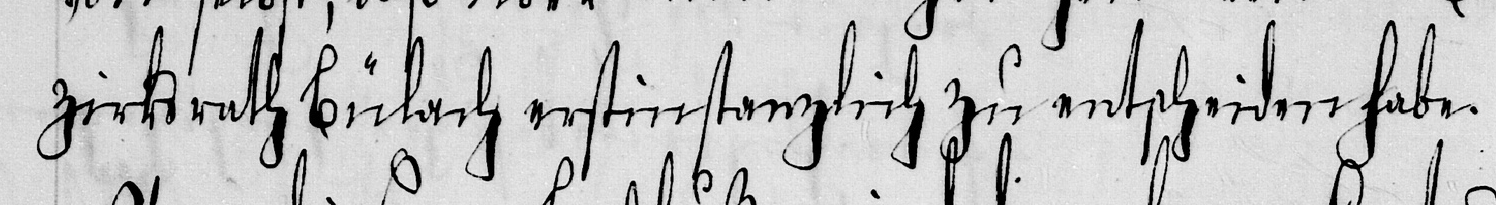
zirksrath Bülach erstinstanzlich zu entscheiden habe.
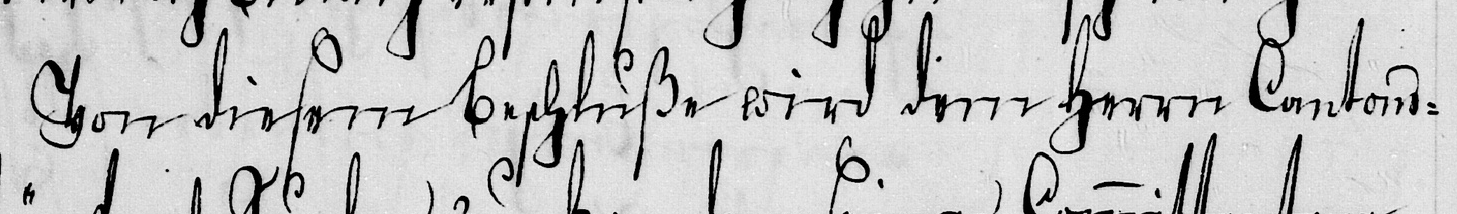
Von diesem Beschluße wird dem Herrn Cantons¬
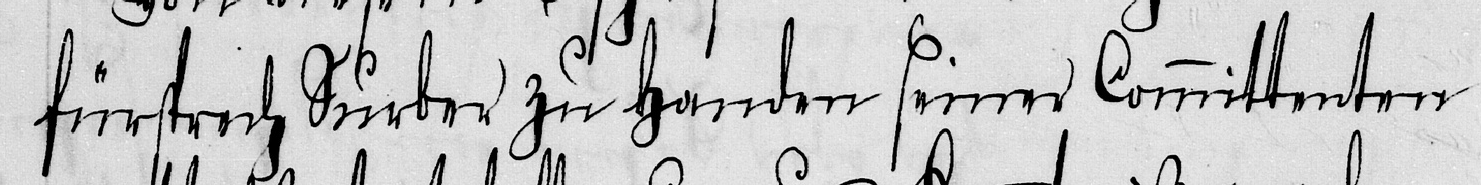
fürsprech Surber zu Handen seiner Committenten
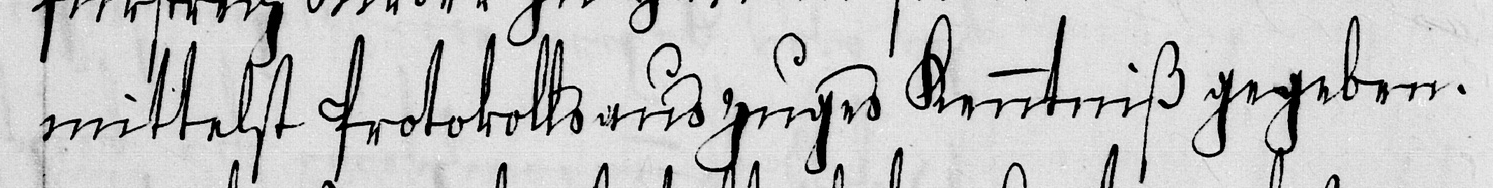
mittelst Protokollsauszuges Kenntniß gegeben.
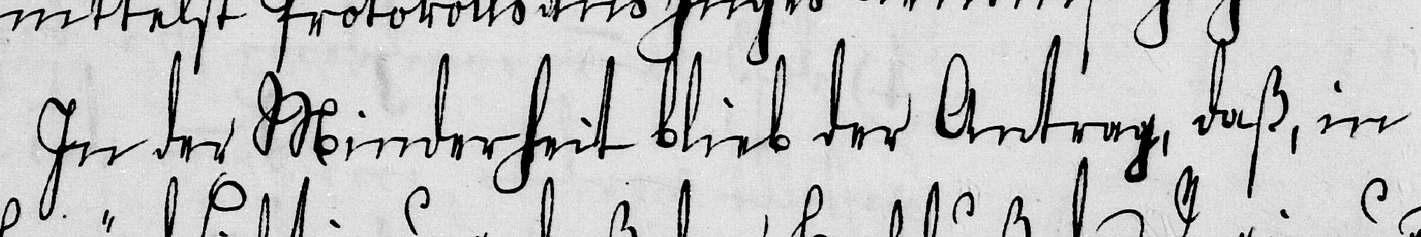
In der Minderheit blieb der Antrag, daß, in
